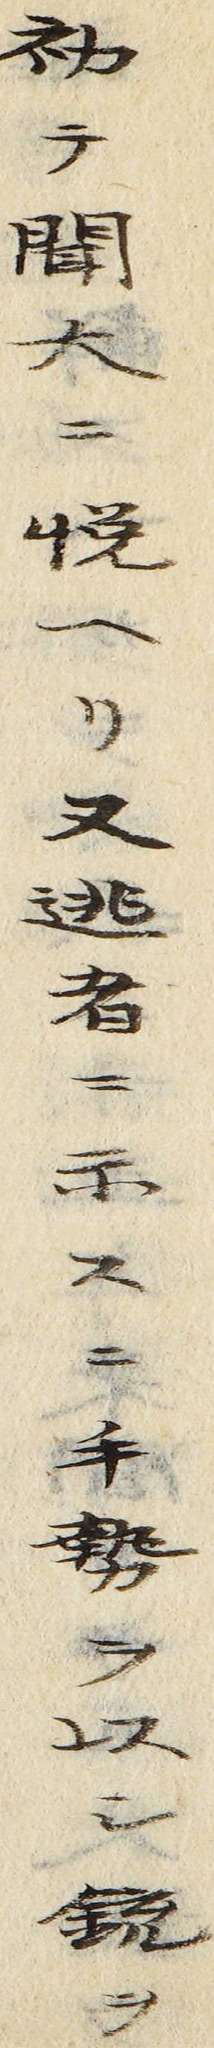初テ聞大ニ悦ヘリ又逃者ニ示スニ手勢ヲ以シ銃ヲ
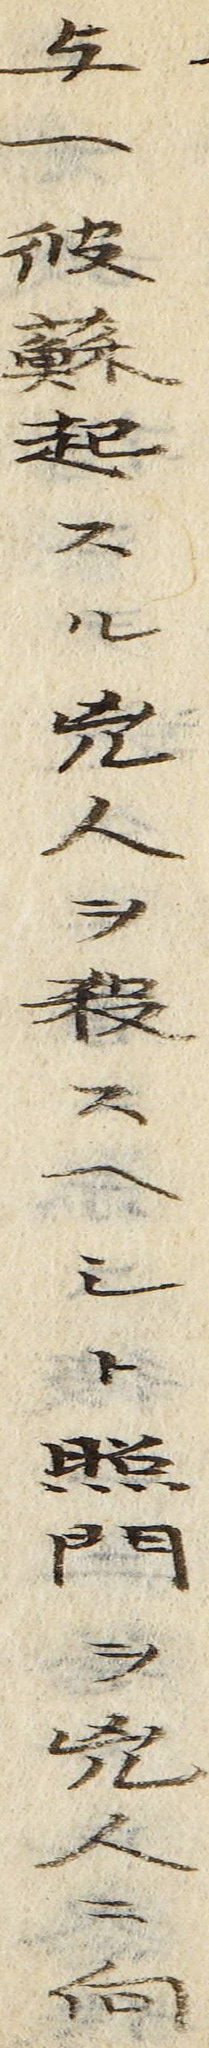与ヘ彼蘇起スル兇人ヲ殺スヘシト照門ヲ兇人ニ向
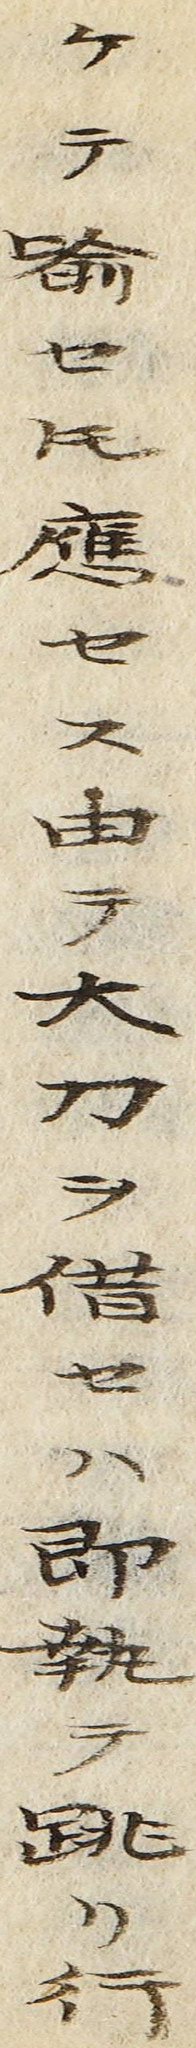ケテ喩セトモ応セス由テ大刀ヲ借セハ即執テ跳リ行
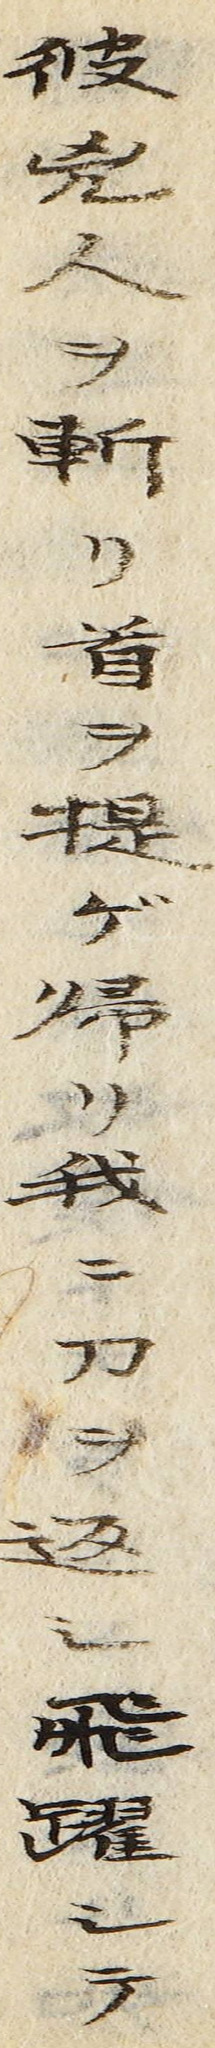彼兇人ヲ斬リ首ヲ提ゲ帰リ我ニ刀ヲ返シ飛躍シテ
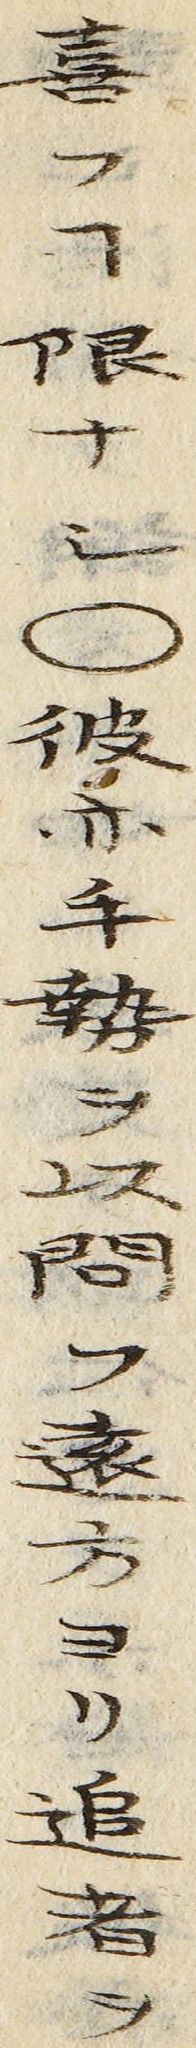喜フコト限ナシ◯彼亦手勢ヲ以問フ遠方ヨリ追者ヲ
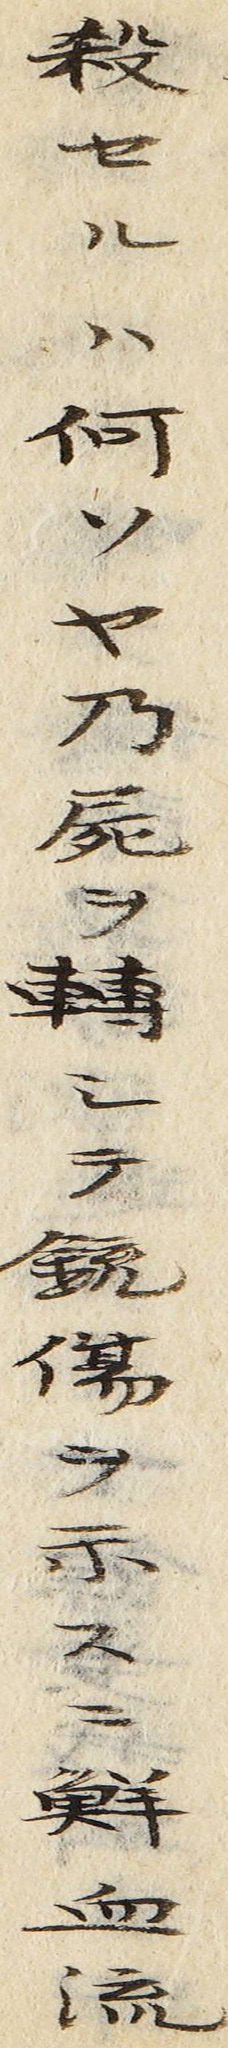殺セルハ何ソヤ乃屍ヲ転シテ銃傷ヲ示スニ鮮血流
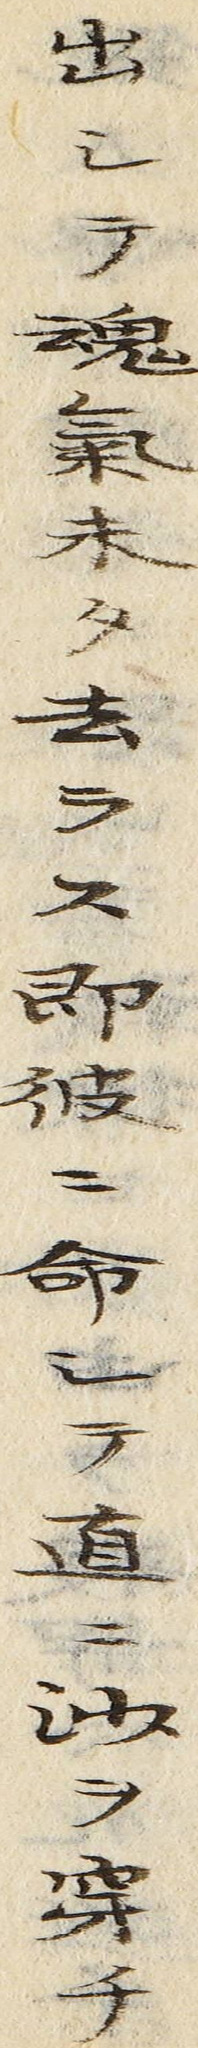出シテ魂気未タ去ラス即彼ニ命シテ直ニ沙ヲ穿チ
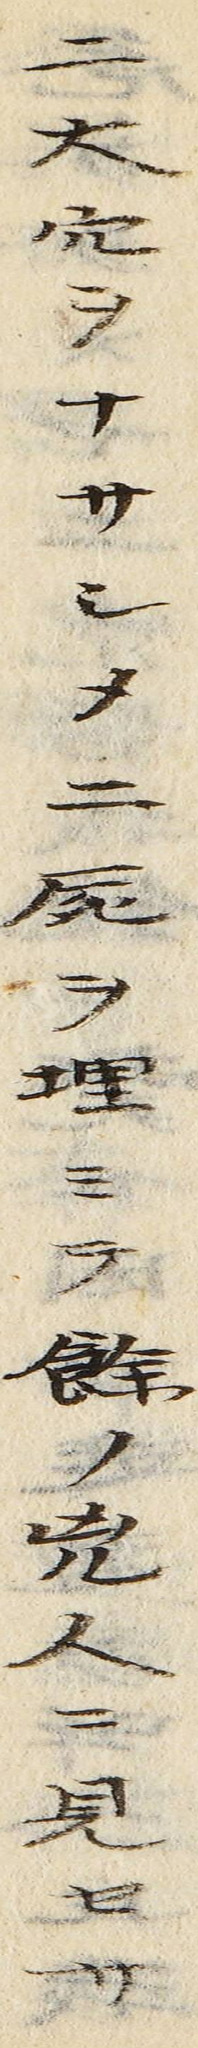二大穴ヲナサレシメ二屍ヲ埋ミテ余ノ兇人ニ見セサ
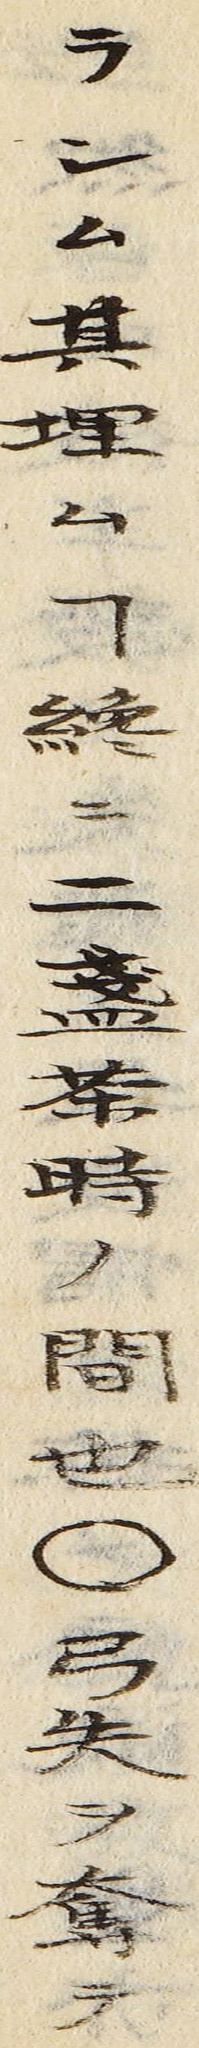ラシム其埋ムコト纔ニ二盞茶時ノ間也◯弓矢ヲ奪テ
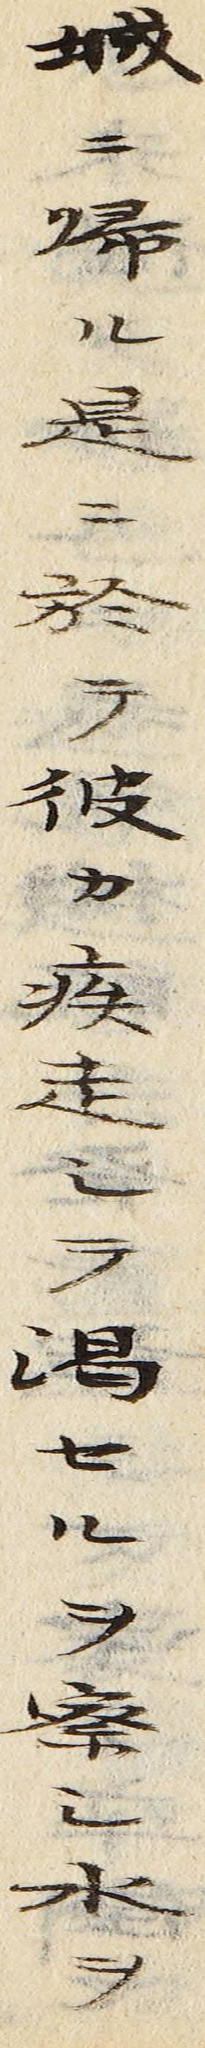城ニ帰ル是ニ於テ彼カ疾走シテ渇セルヲ察シ水ヲ
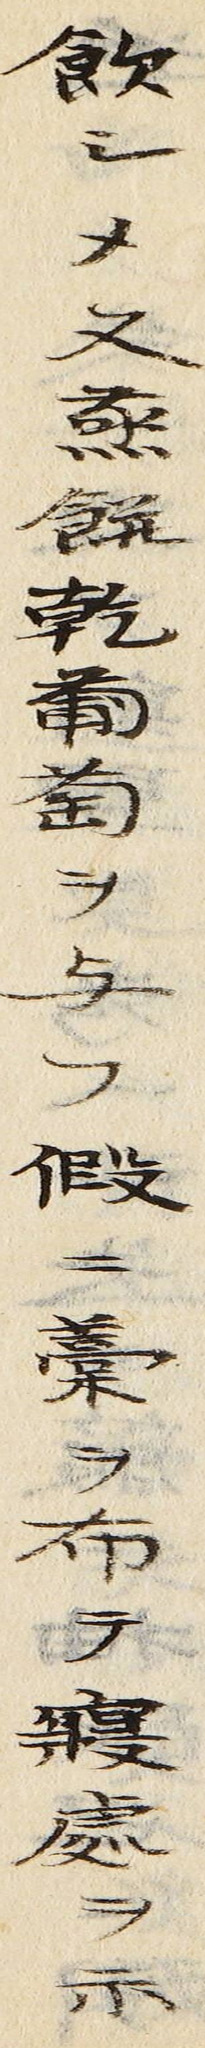飲シメ又蒸餅乾葡萄ヲ与フ假ニ藁ヲ布テ寝処ヲ示
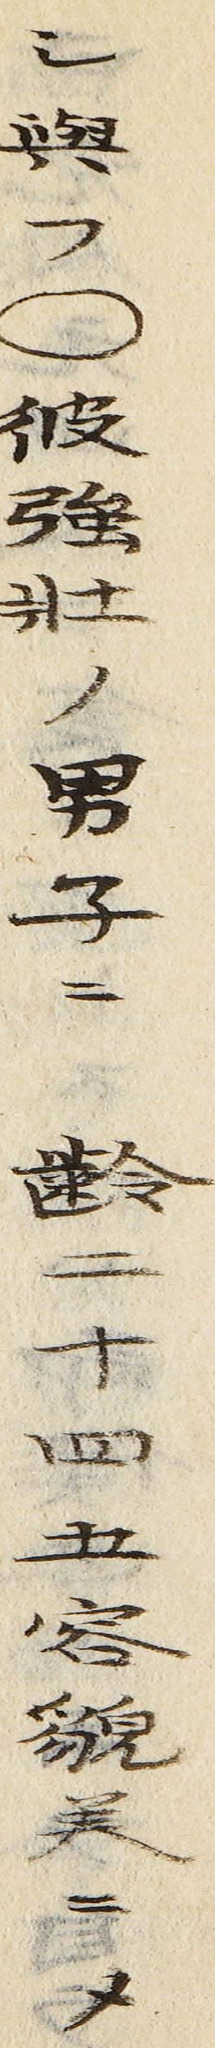シ与フ◯彼強壮ノ男子ニ齢二十四五容貌美ニシテ
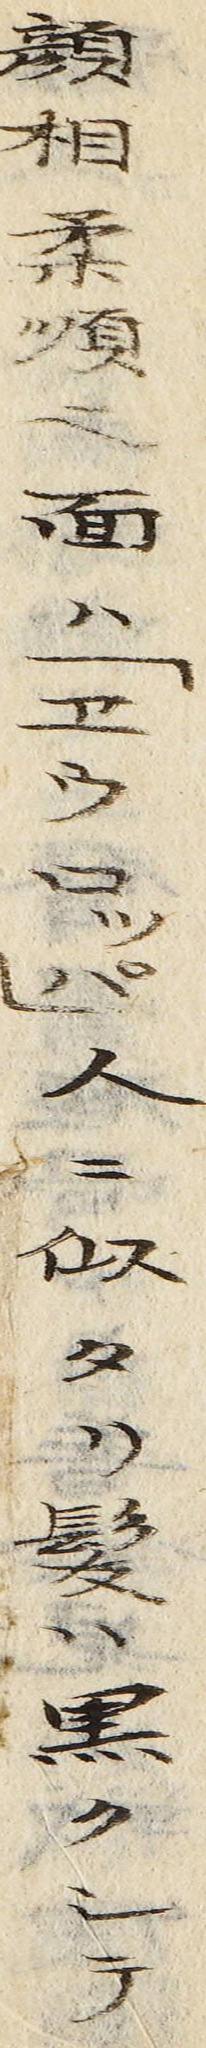顔相柔順也面ハ「ヱウロッパ」人ニ似タリ髪ハ黒クシテ
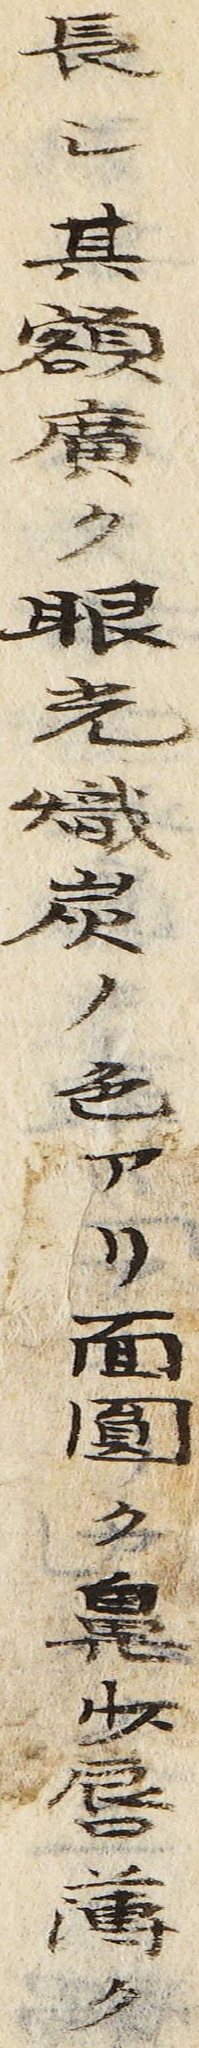長シ其額広ク眼光熾炭ノ色アリ面円ク鼻少唇薄ク
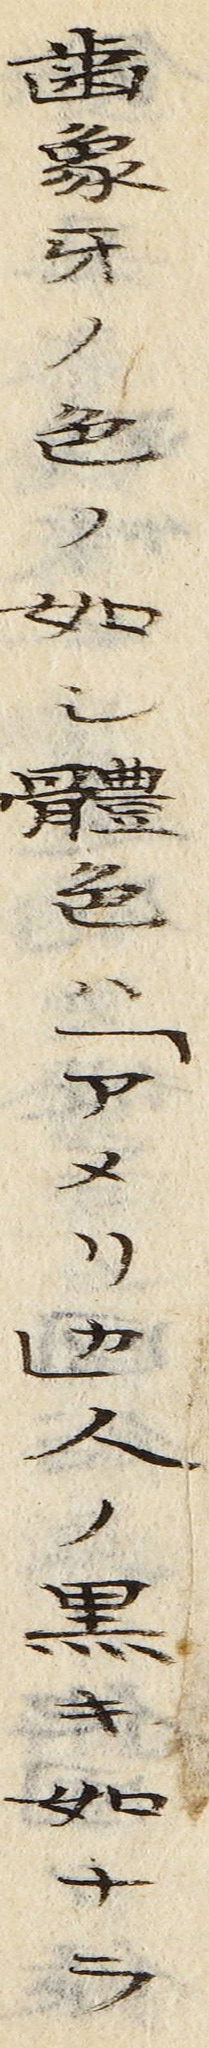歯象牙ノ色ノ如シ体色ハ「アメリカ」人ノ黒キ如ナラ
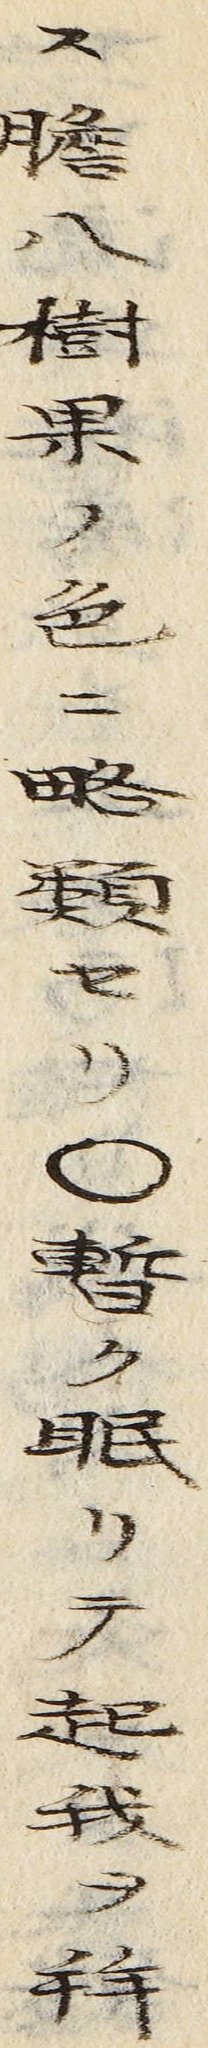ス膽八樹果ノ色ニ略類セリ◯暫ク眠リテ起我ヲ拝
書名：漂流紀事
